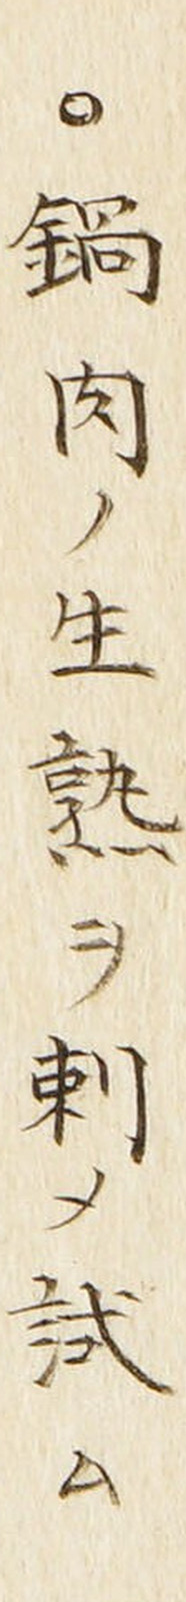〇鍋肉ノ生熟ヲ刺シテ試ム二尺

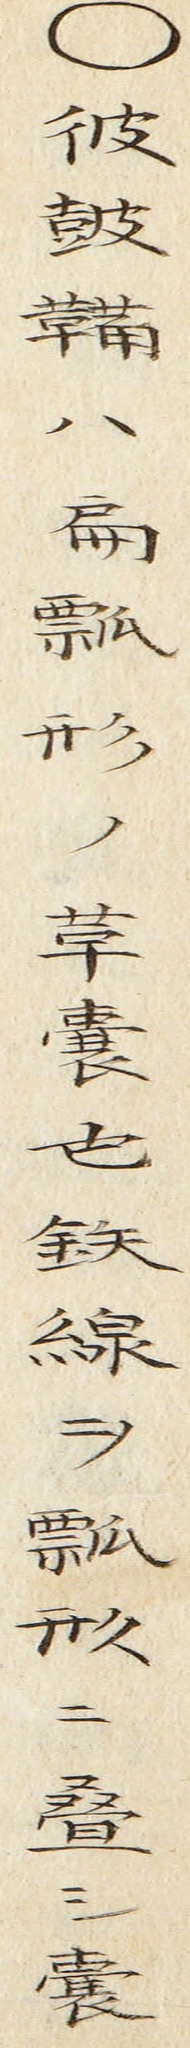〇彼鼓鞴ハ扁瓢形ノ革嚢也鉄線ヲ瓢形ニ畳シ嚢
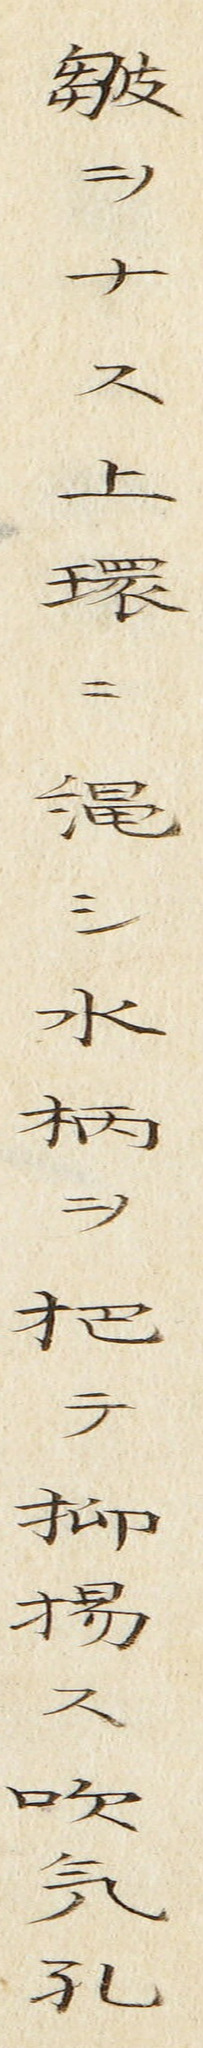皺ヲナス上環ニ縄シ水柄ヲ把テ抑揚ス吹気孔
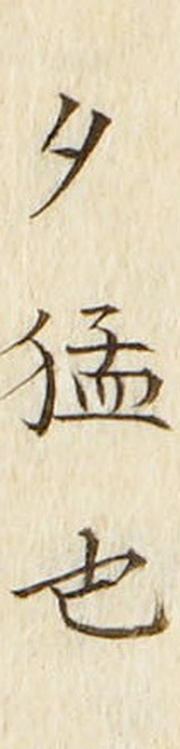夕猛也
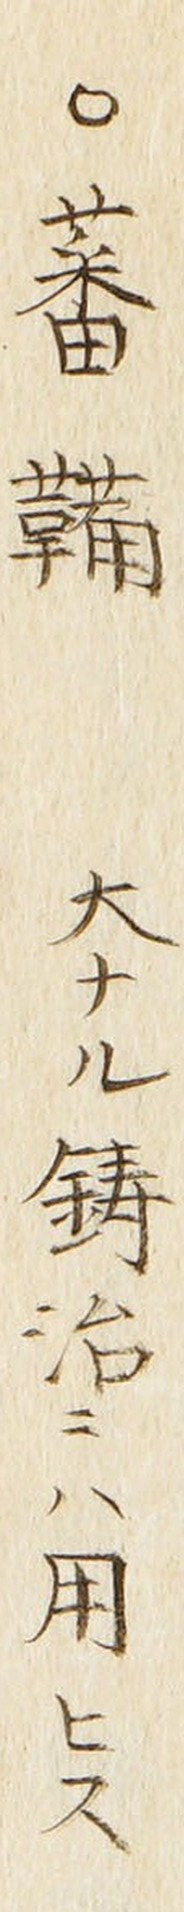蕃鞴大ナル鋳治ニハ用ヒス
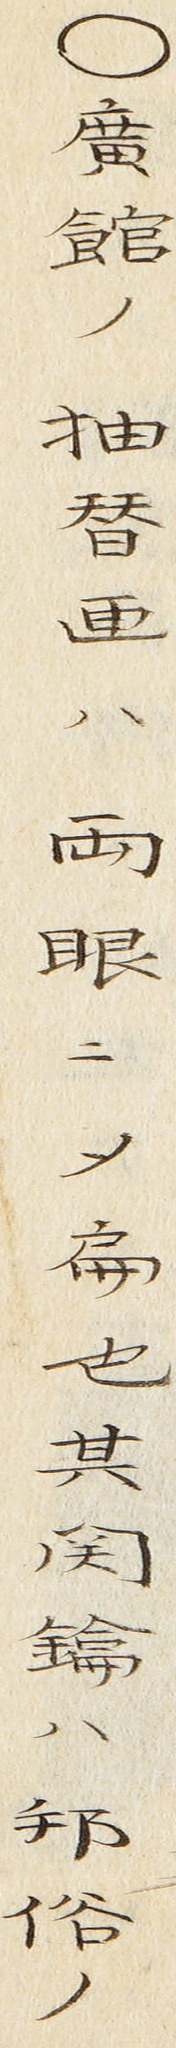〇広館ノ抽替匣ハ両眼ニシテ扁也其関鑰ハ邦俗ノ
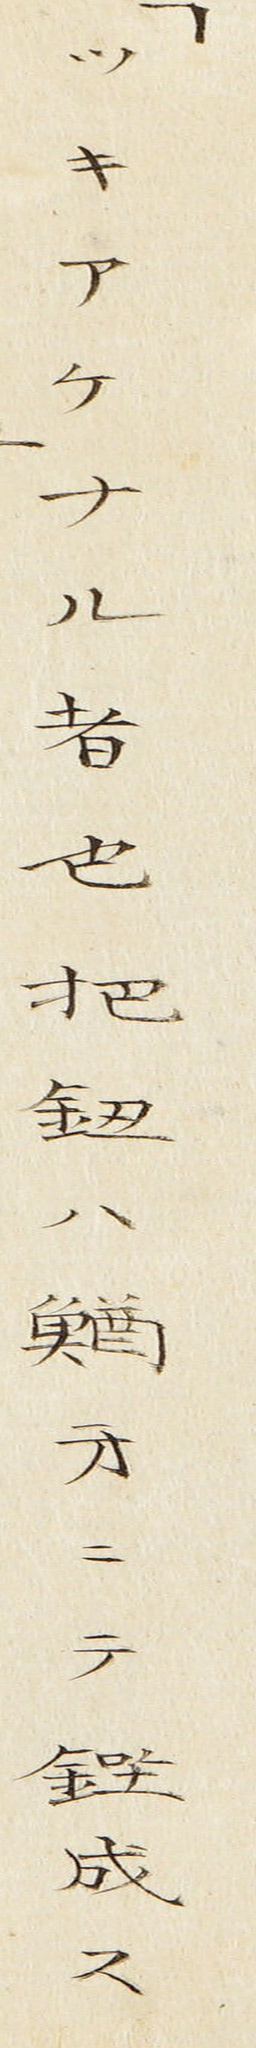「ツキアケ」ナル者也把鈕ハ鰌牙？ニテ銼成ス

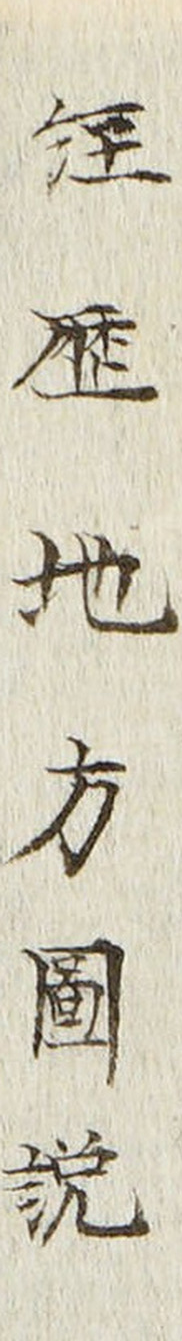経歴地方図説尊
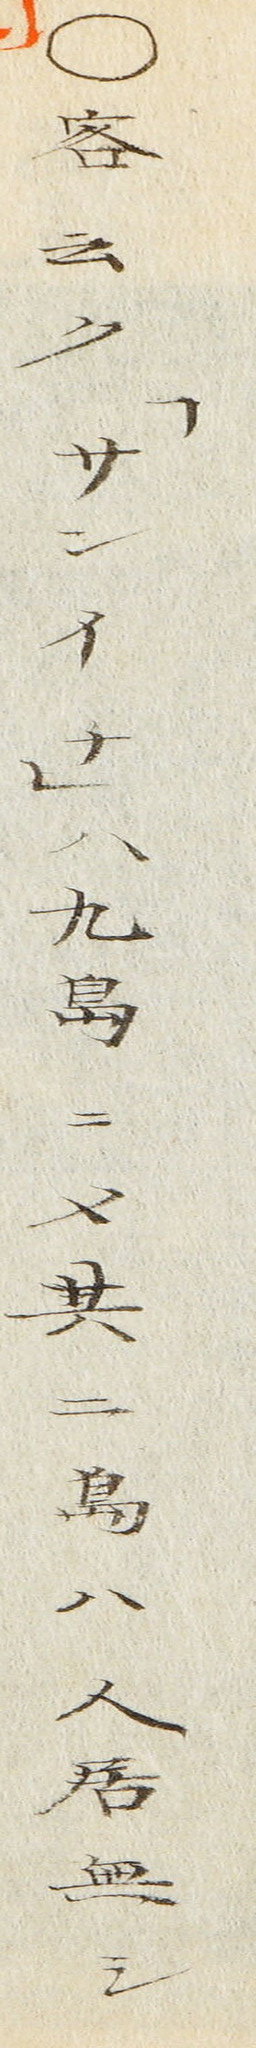〇客云ク「サンイナ」ハ九島ニシテ其ニ島ハ人居無シ
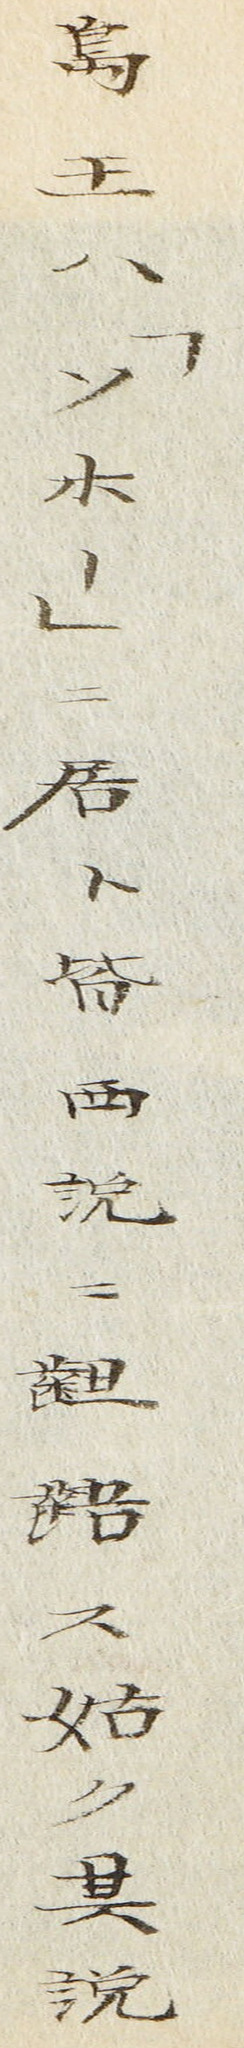島王ハ「ソホー」ニ居ト皆西説ニ齟齬ス姑ク其説
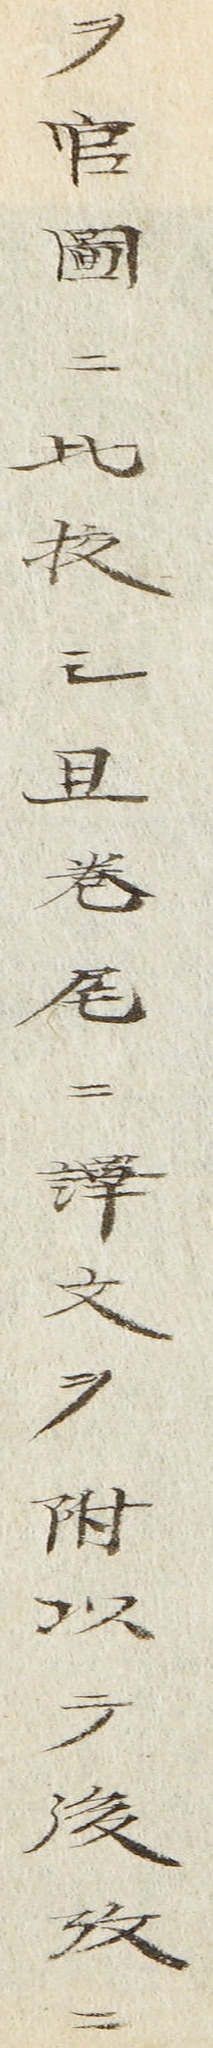ヲ官図ニ比校シ且巻尾ニ譯文ヲ附以テ後攷ニ
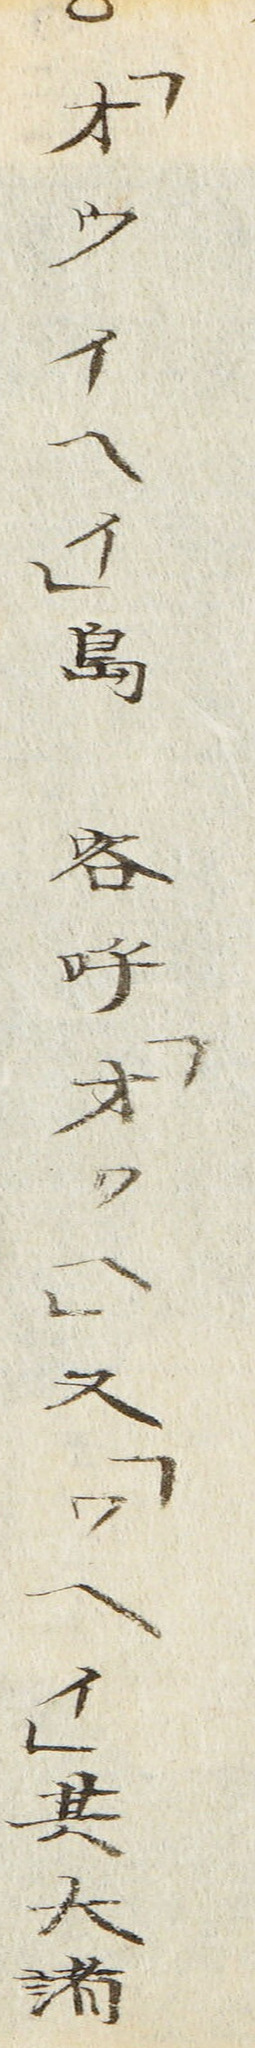〇「オウイヘイ」島客呼「オワヘ」又「ワヘイ」其大諸
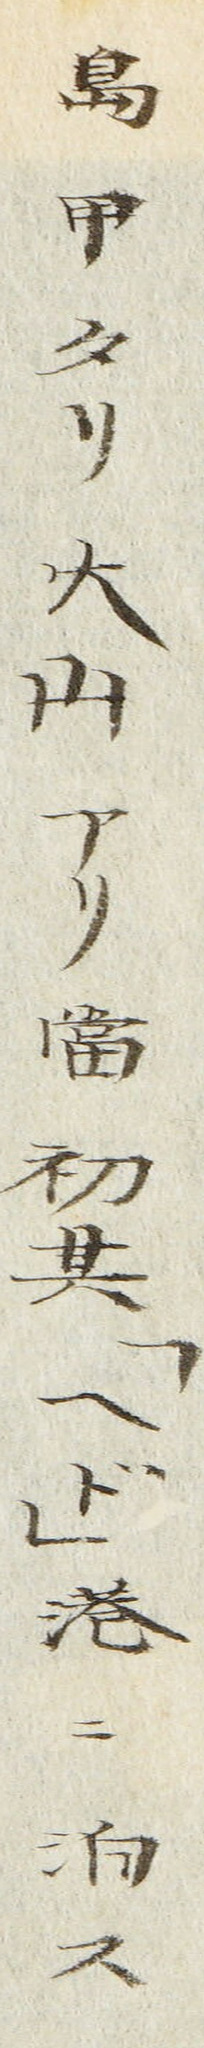島甲タリ大山アリ当初其「ヘド」港ニ泊ス
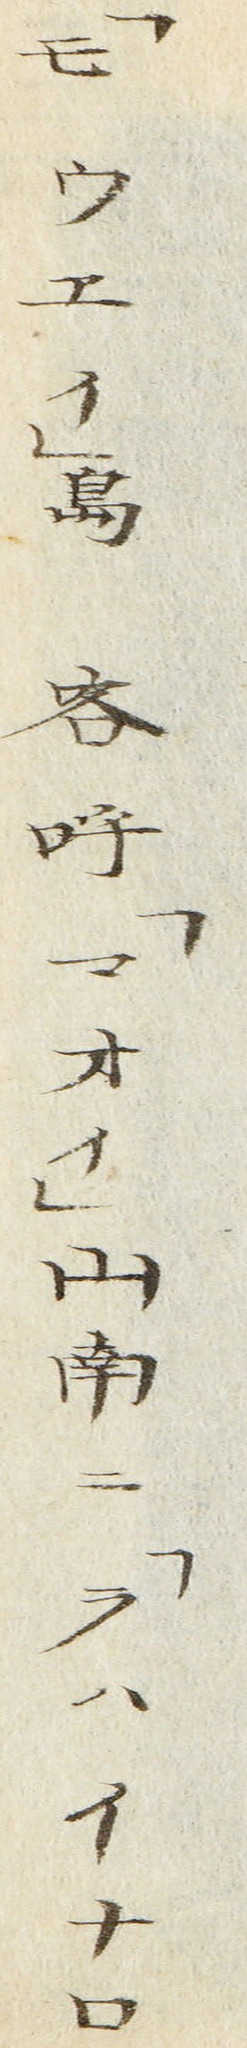〇「モウエイ」島客呼「マオイ」山南ニ「ヲハイナロ
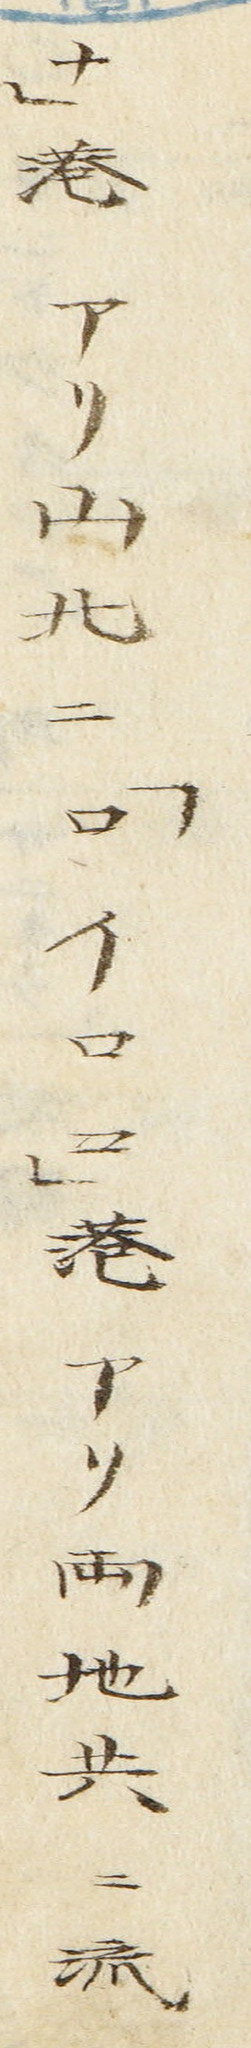ナ」港アリ山北ニ「ロイロコ」港アリ両地共ニ流

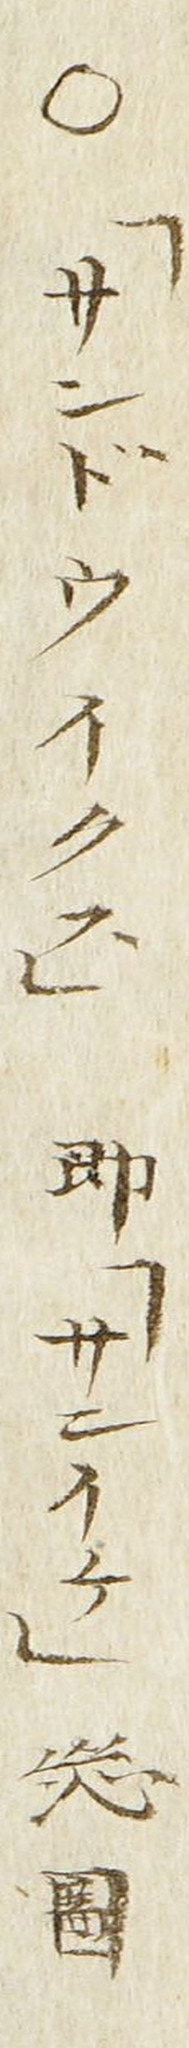〇「サンドウイクス」即「サンイケ」図
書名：蕃談
